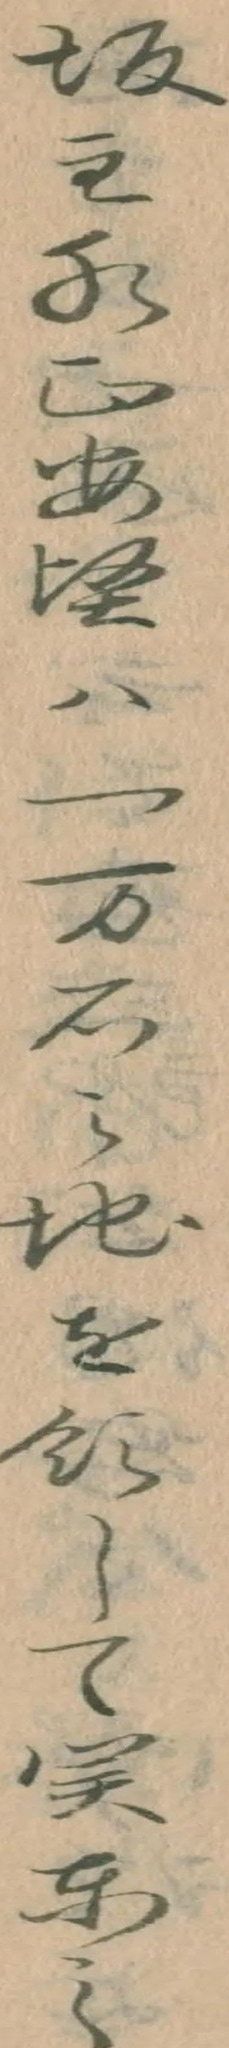坂主水正安堅は一万石之地を領して関東之
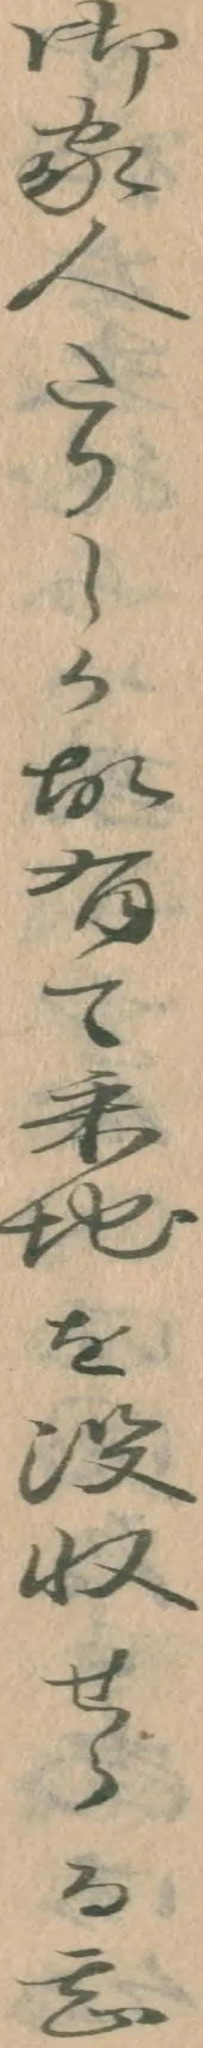御家人たりしか故有て釆地を没収せらる甚
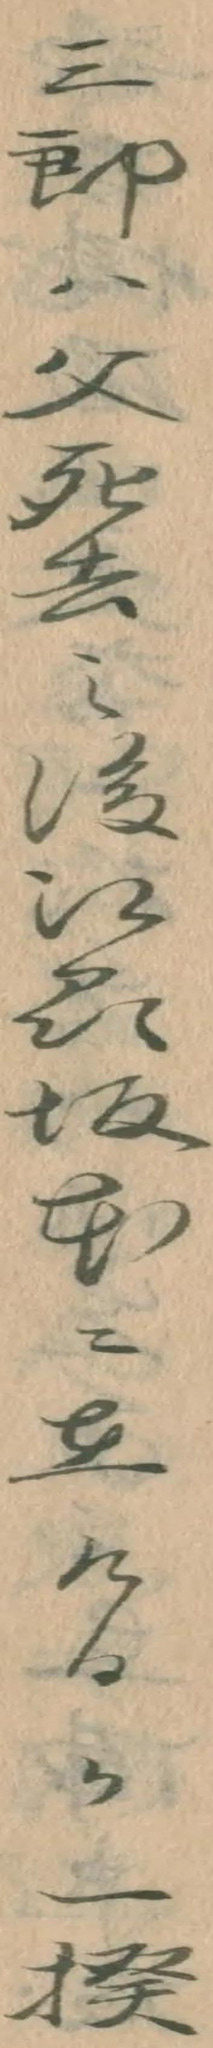三郎は父死去之後江州坂本に在けるか一揆
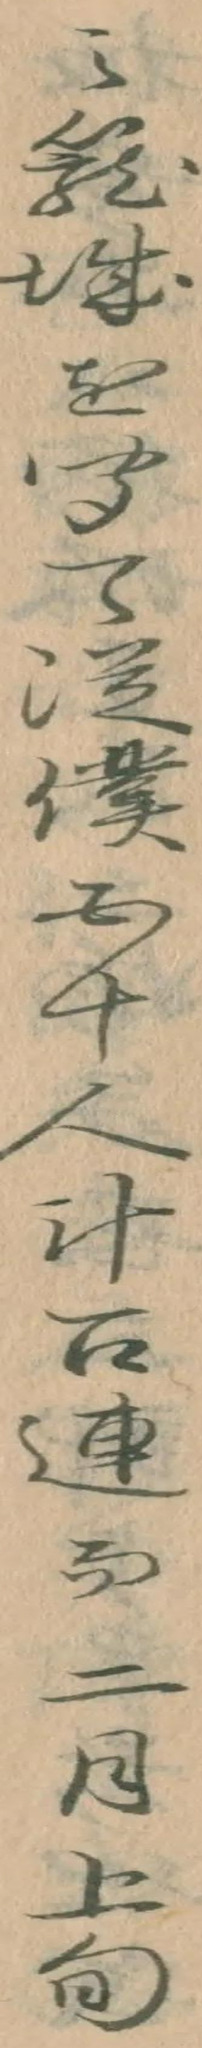之籠城を聞て従僕五十人斗召連而二月上旬
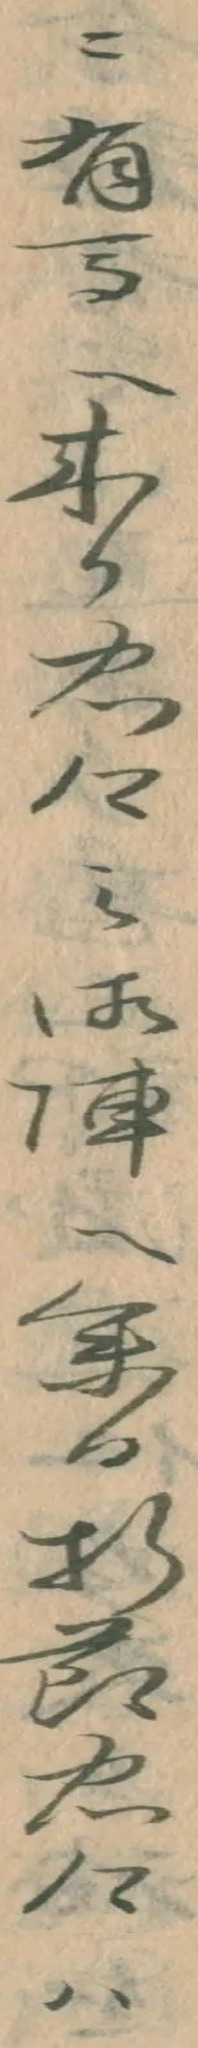に有馬へ来り忠郷之御陣へ参る折節忠郷は
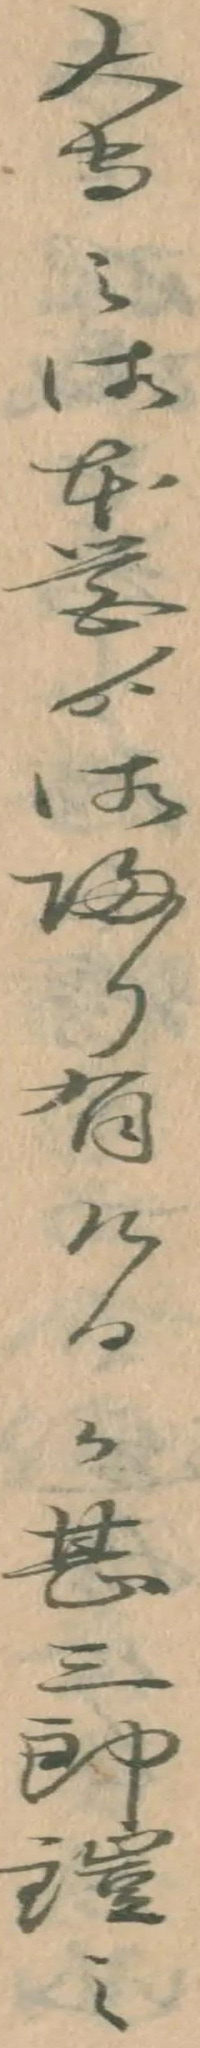大守之御本営ゟ御帰り有けるか甚三郎鎧之

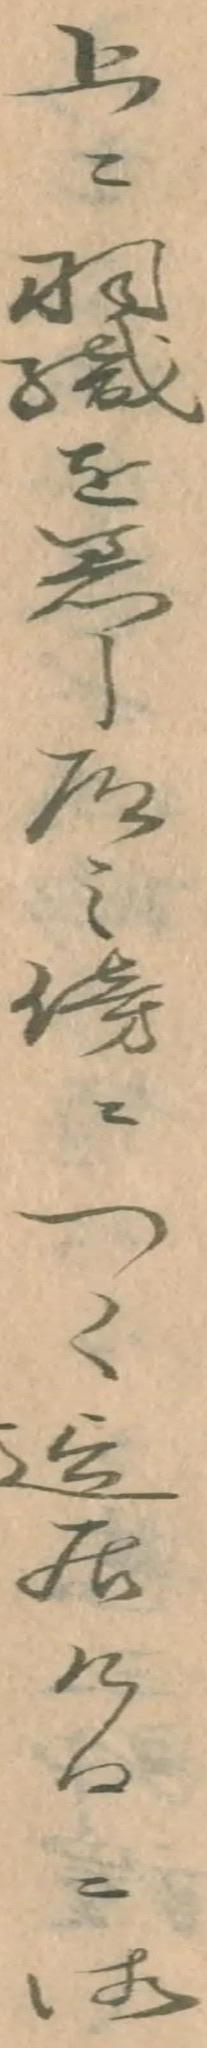上に羽織を着し道之傍につく辺居けるに御
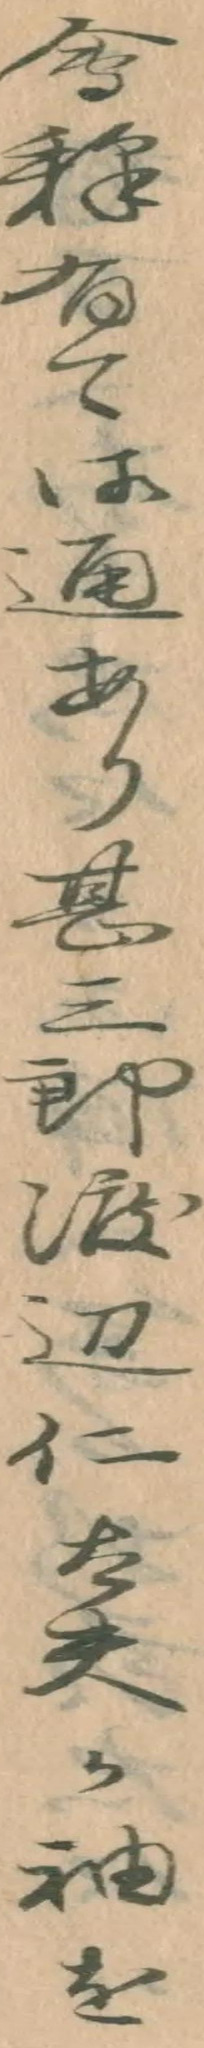会釋有て御通あり甚三郎渡辺仁太夫か袖を
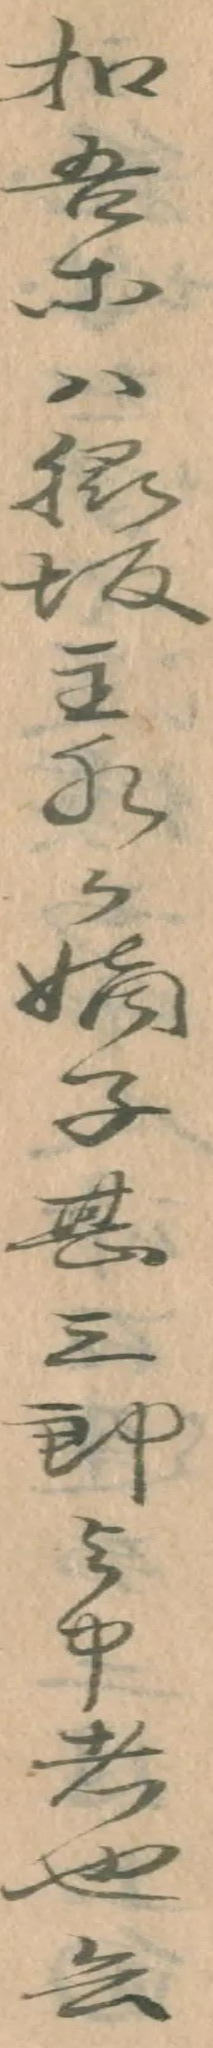扣吾等は脇坂主水か嫡子甚三郎与申者也兵
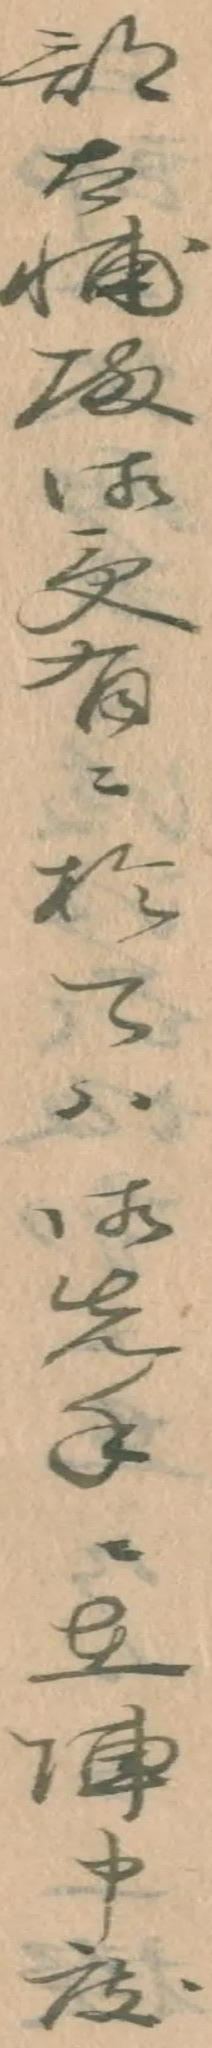部太輔殿御受有に於ては御先手に在陣申度
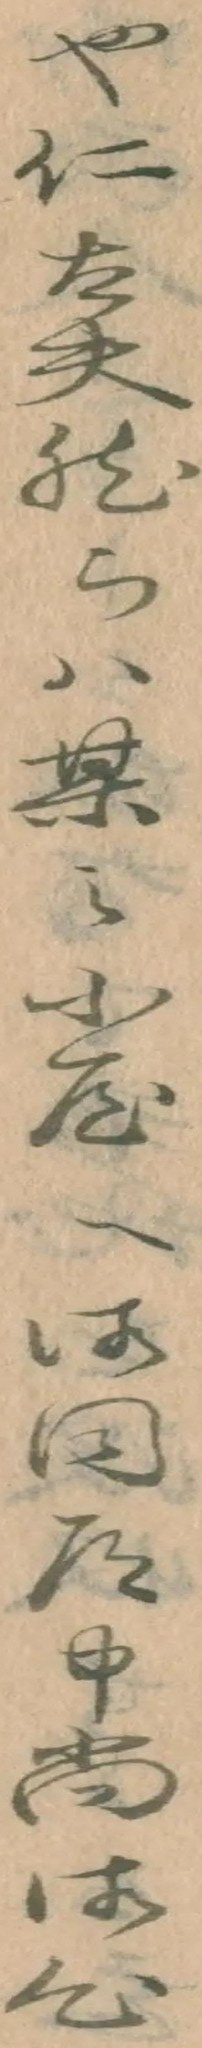や仁太夫然らは某之小屋へ御同道申尚御心
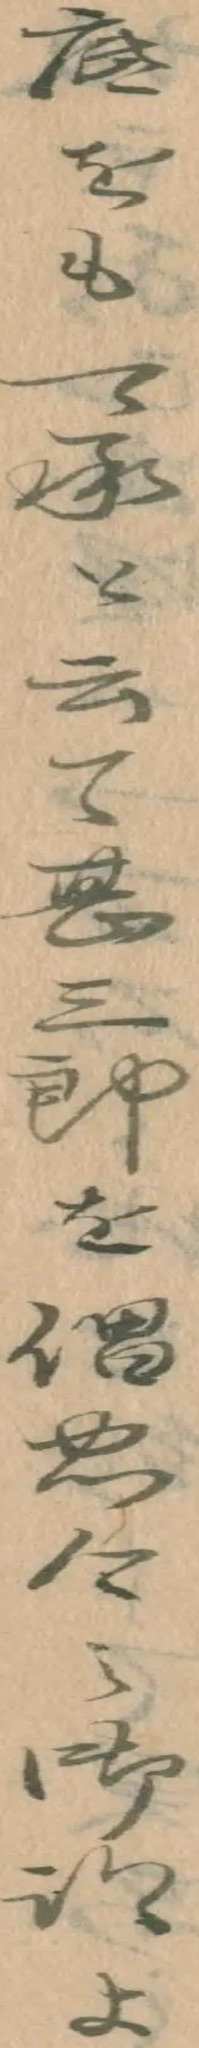底をも可承と云て甚三郎を偲忠郷之御跡よ
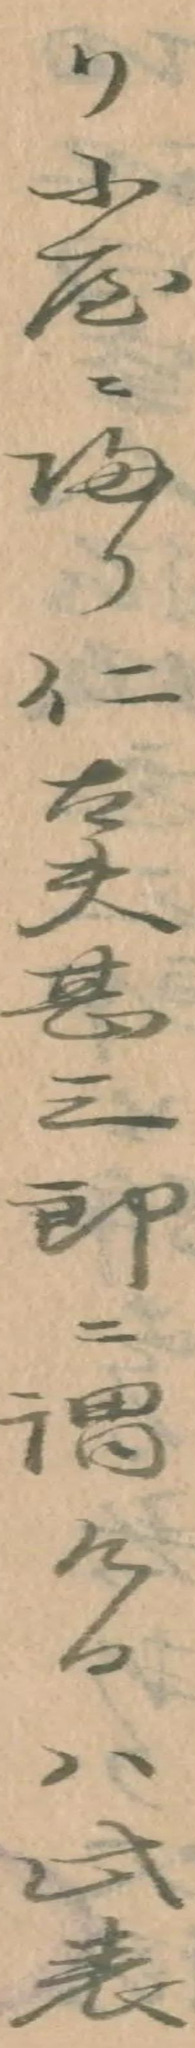り小屋に帰り仁太夫甚三郎に謂けるは此表
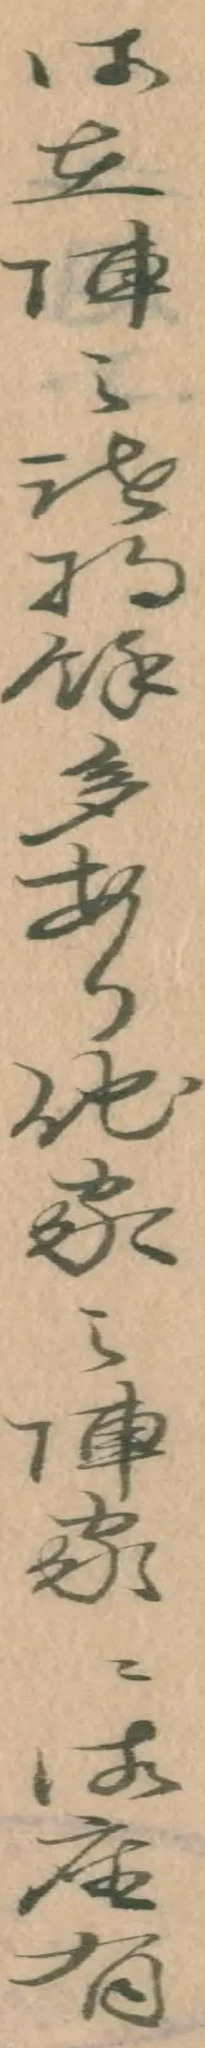御在陣之諸将余多あり他家之陣家に御座有
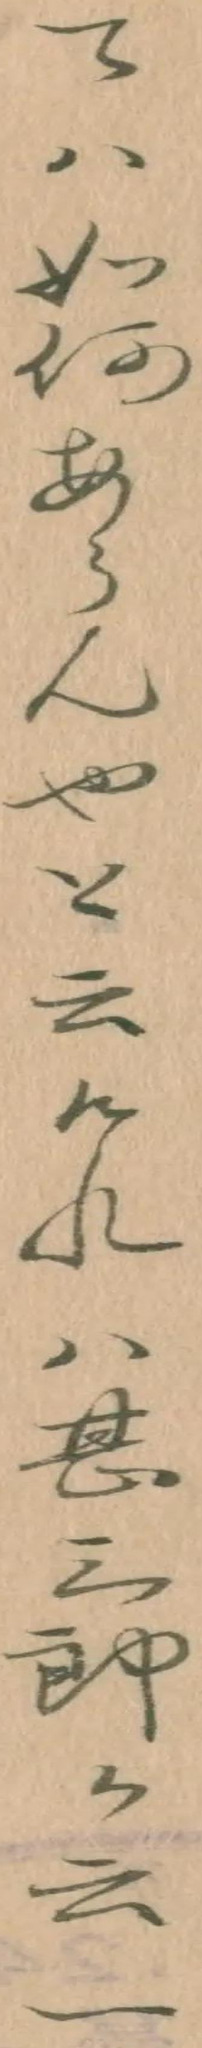ては如何あらんやと云けれは甚三郎か云一
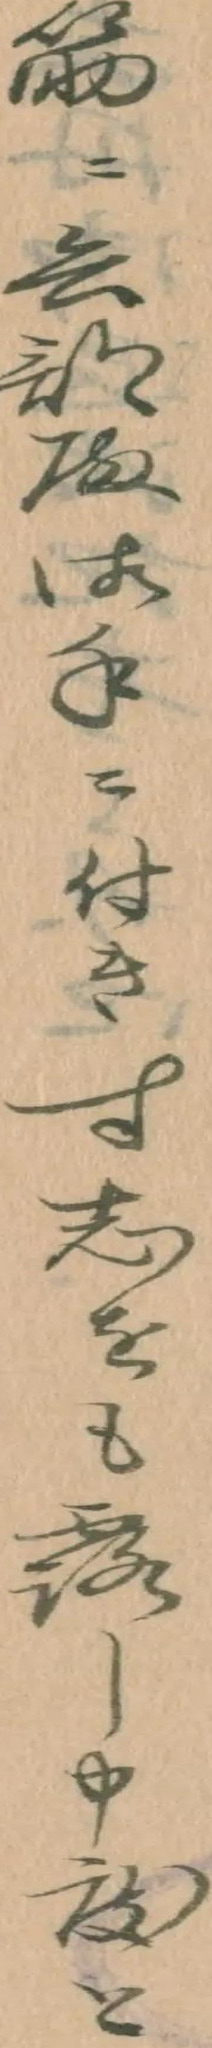筋に兵部殿御手に付き寸志をも露し申度と
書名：切支丹御退治記 49巻. [6]
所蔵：国立国会図書館 National Diet Library, JAPAN
